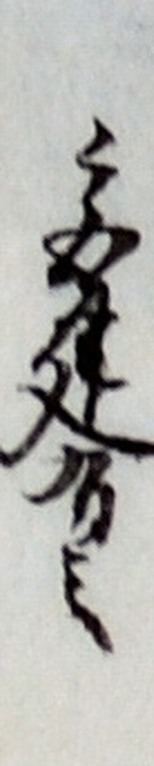宮建有之
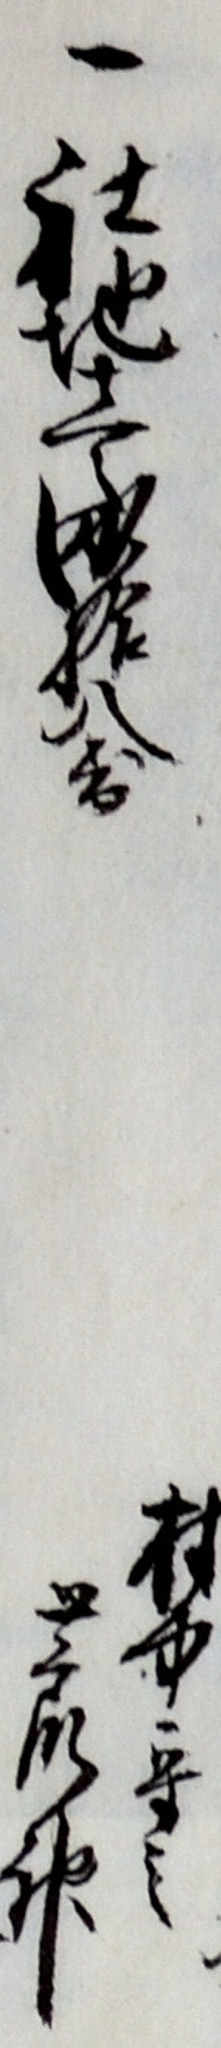一社地壱畝拾八歩荒神
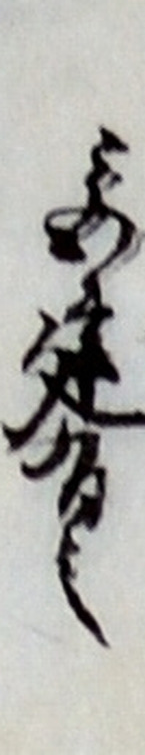宮建有之
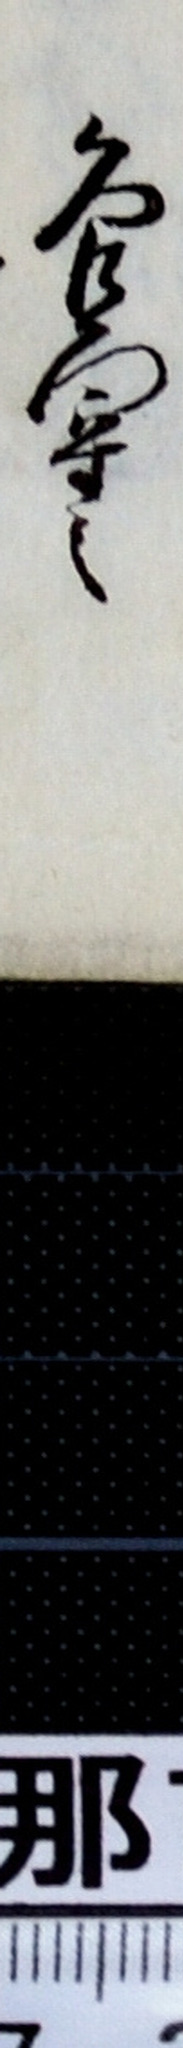久左衛門守之
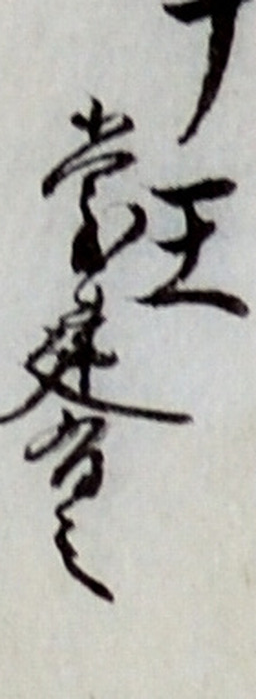宮建有之

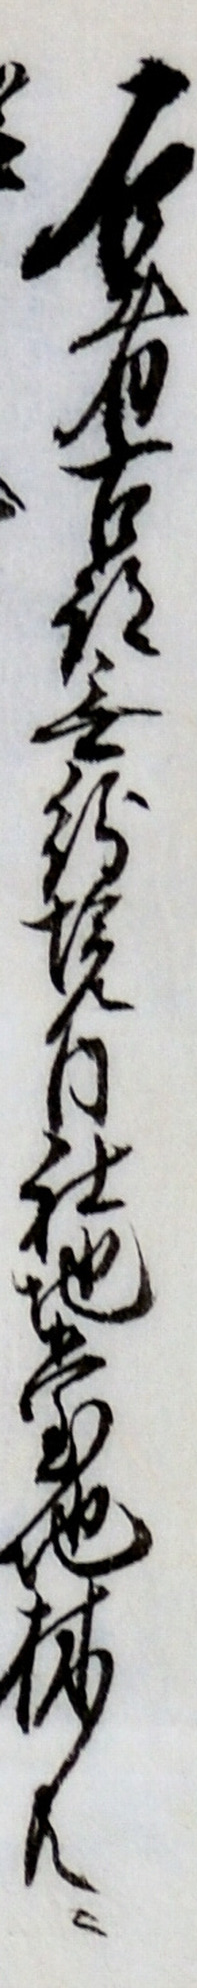右者古跡無粉境内社地堂地林共ニ
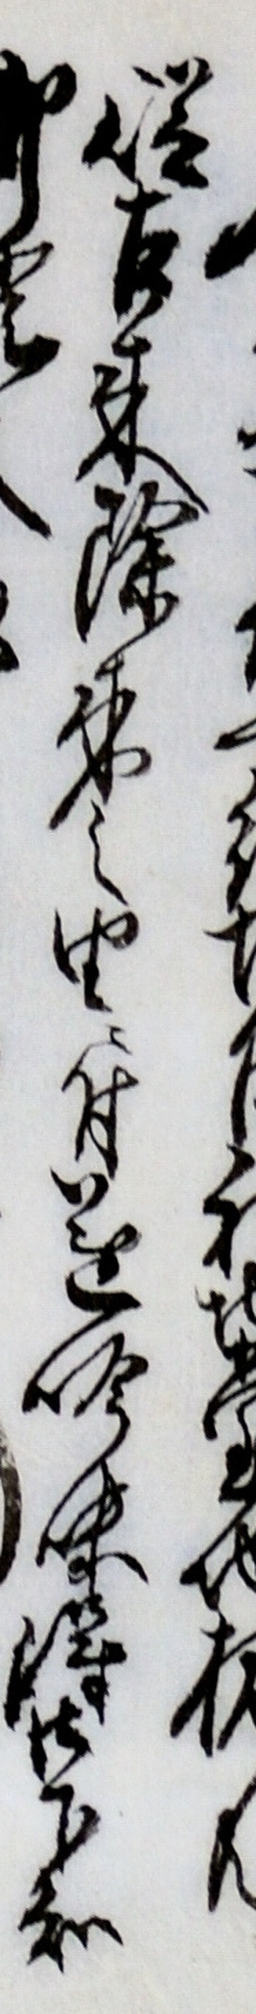従古来除来之由ニ付進吟味得御下知
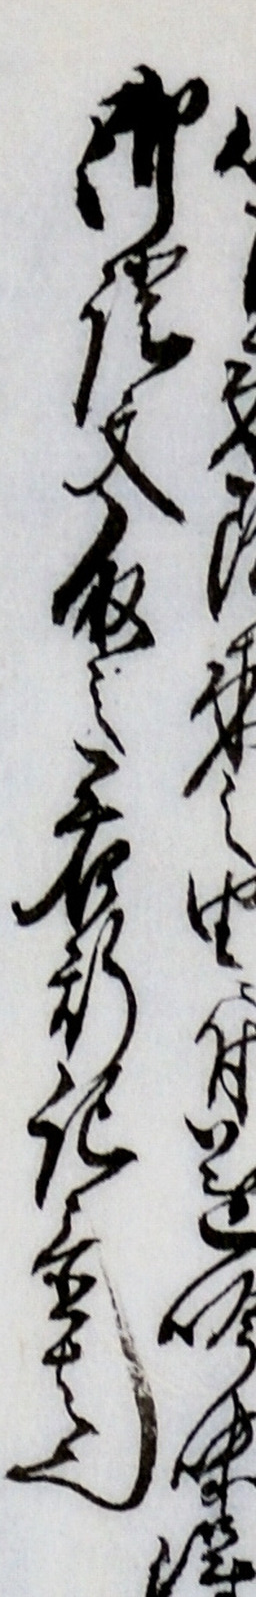御証文取之若斯記置者也
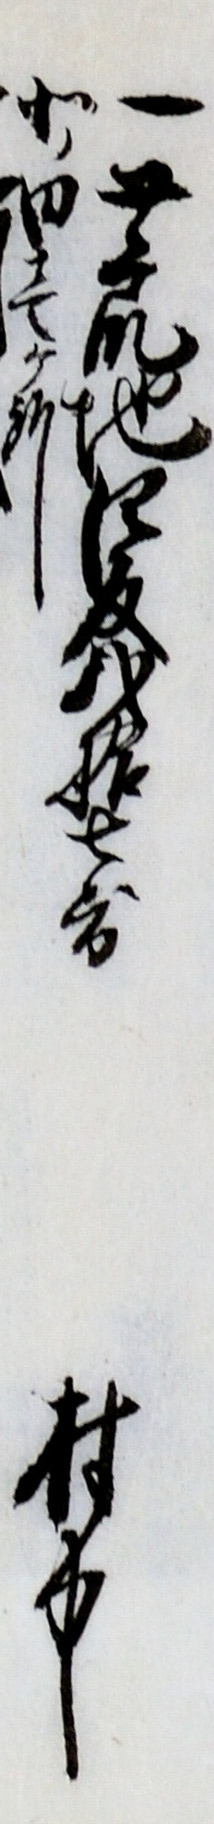一荒地四反弐拾七歩村中
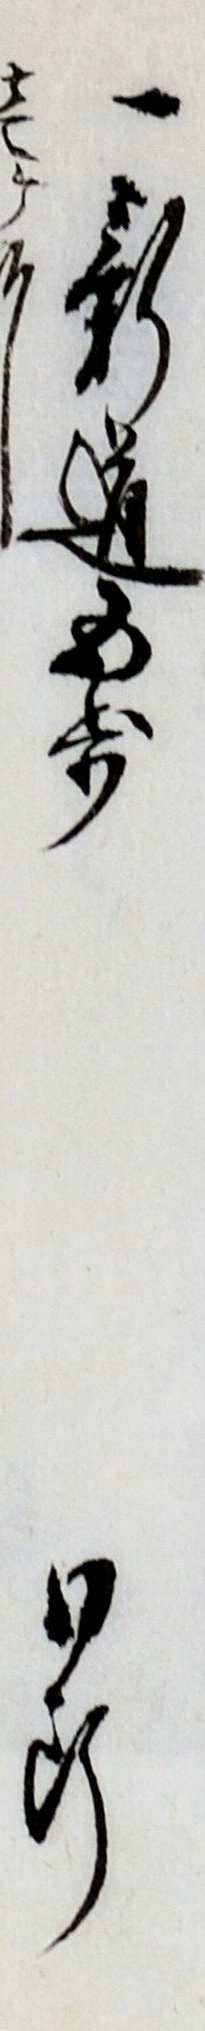一新道五歩同断
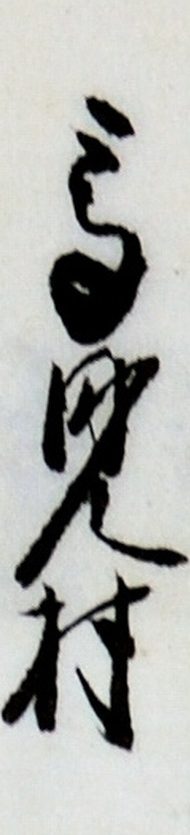高見村
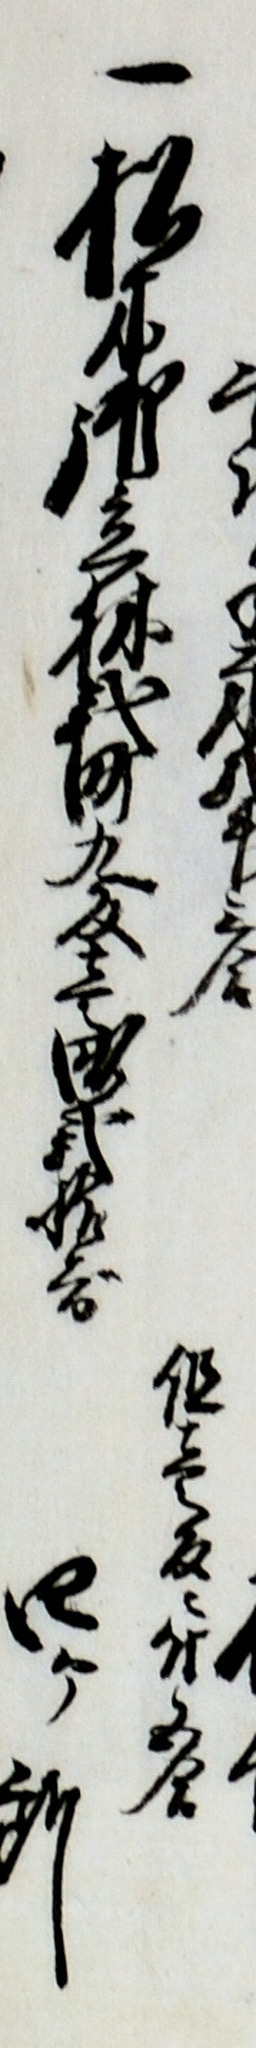一松木御立林弐町九反壱畝弐拾歩四ヶ所
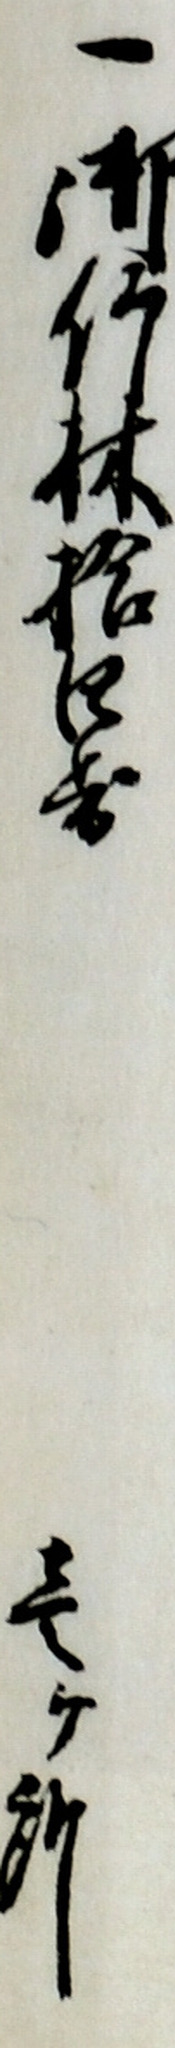一御竹林拾四歩壱ヶ所
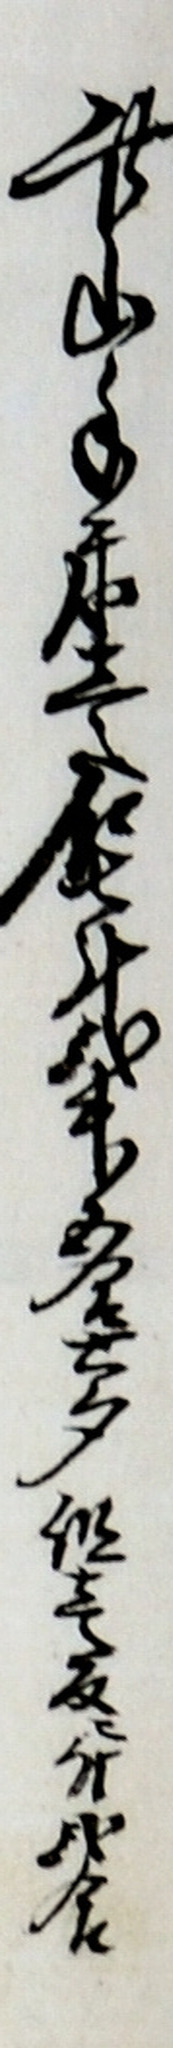此山手米壱石七斗弐升五合六勺但壱反ニ付弐合
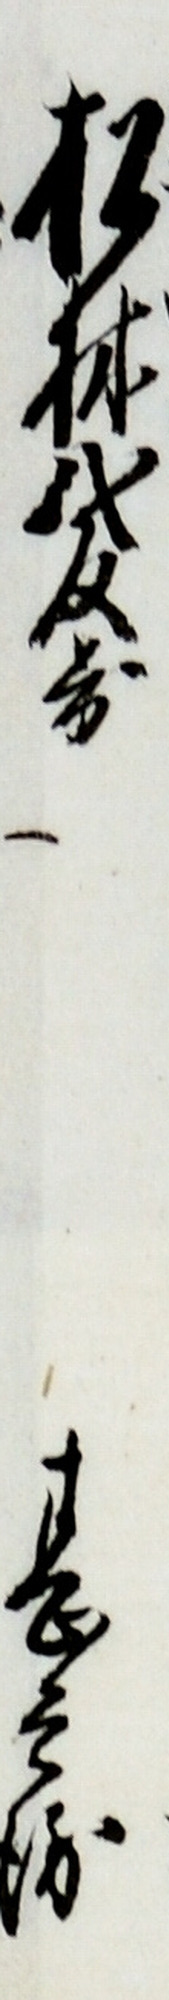松林弐反歩甚兵衛
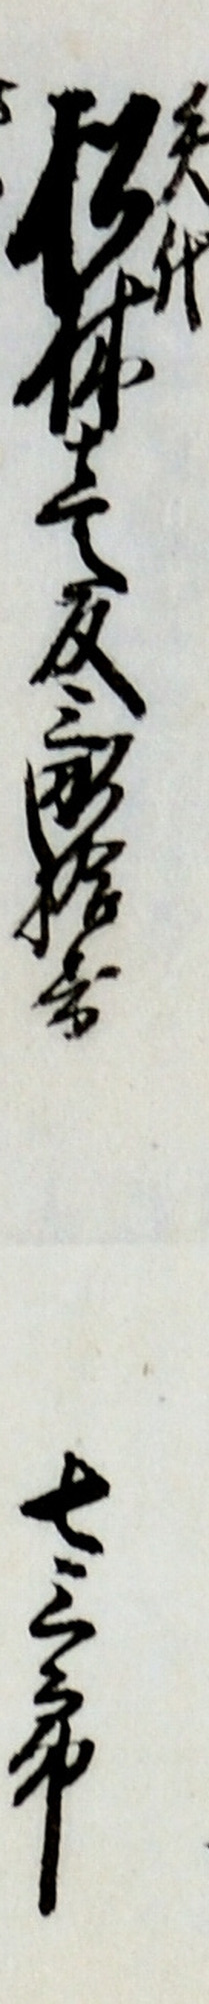松林壱反三畝拾歩七三郎
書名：御領分中山林社地手控
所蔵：伊那市立高遠町図書館・合同会社AMANE
